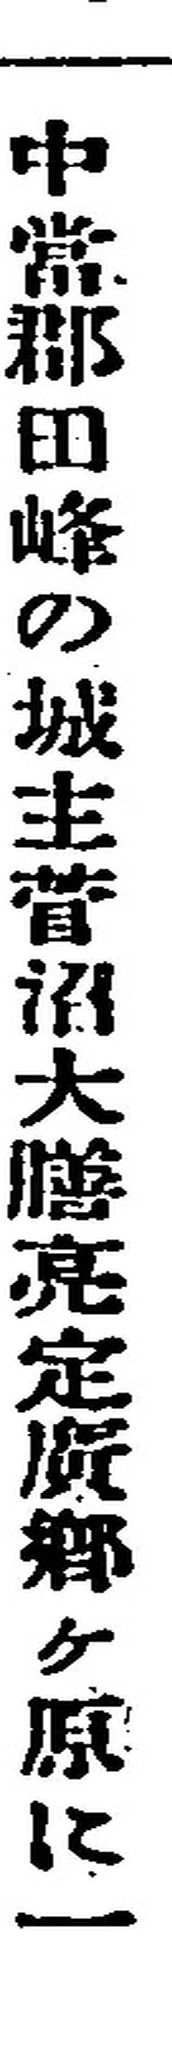中当郡田峰の城主菅沼大膳亮定広郷ヶ原に一
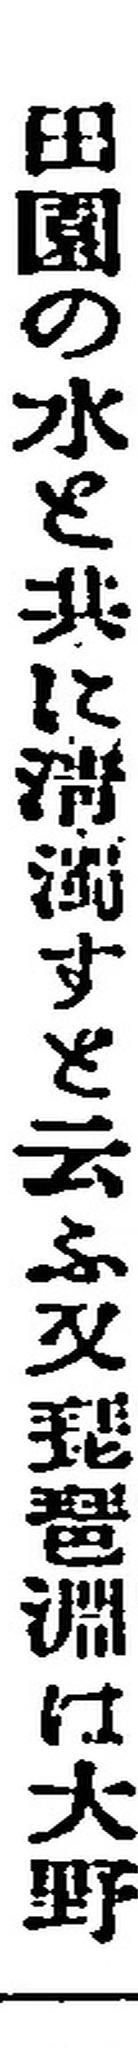田園の水と共に清濁すと云ふ又琵琶淵は大野
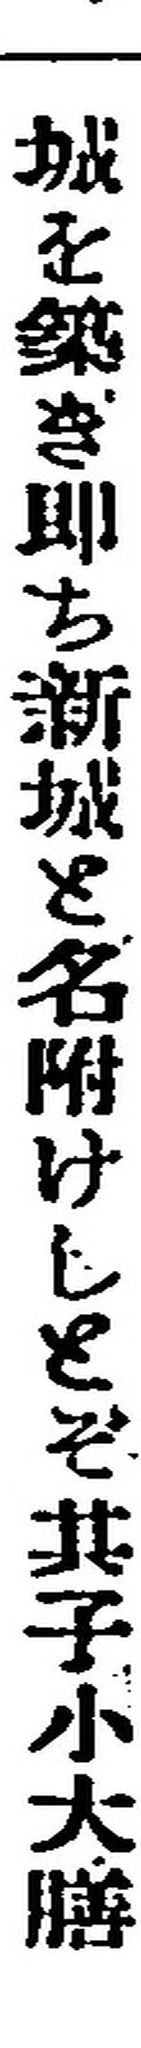城を築き即ち新城と名附けしとぞ其子小大膳
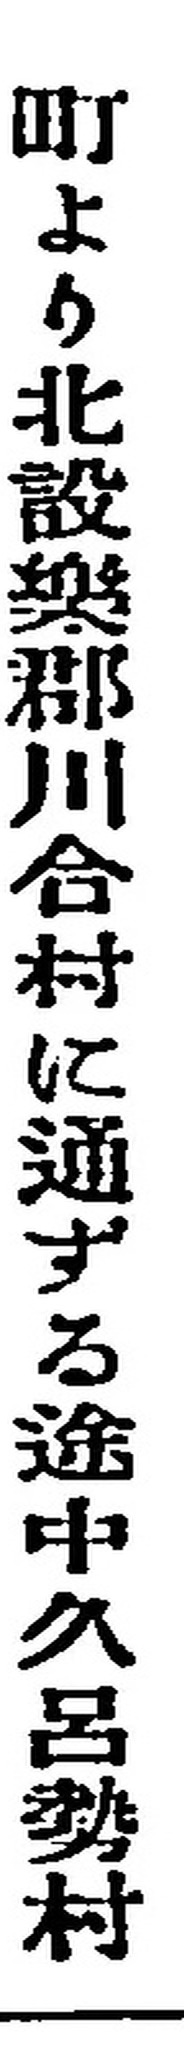町より北設楽郡川合村に通ずる途中久呂勢村
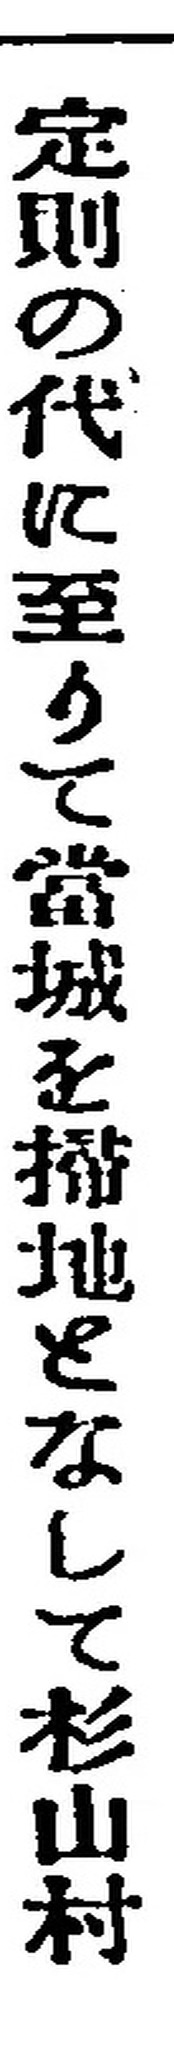定則の代に至りて当城を掃地となして杉山村
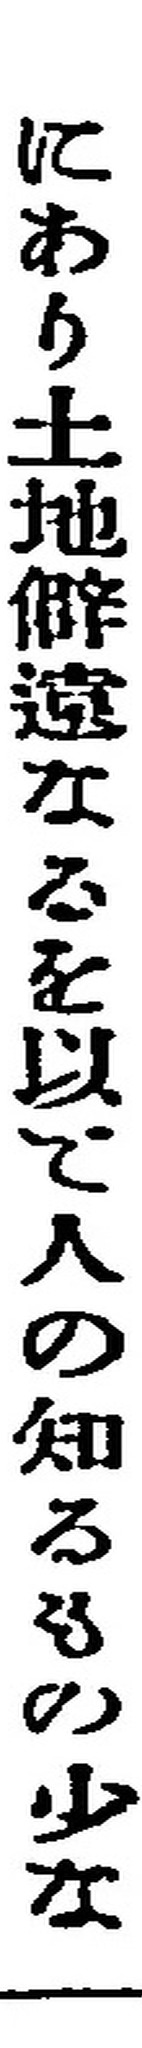にあり土地僻遠なるを以て人の知るもの少な
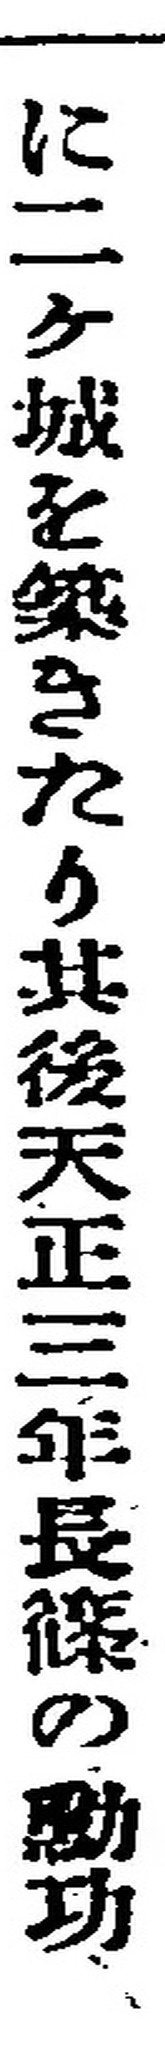に二ヶ城を築きたり其後天正三年長篠の勲功
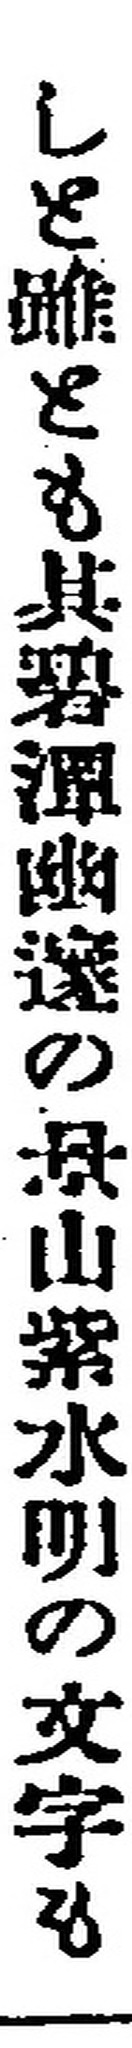しと雖とも其碧渾幽邃の景山紫水明の文字も
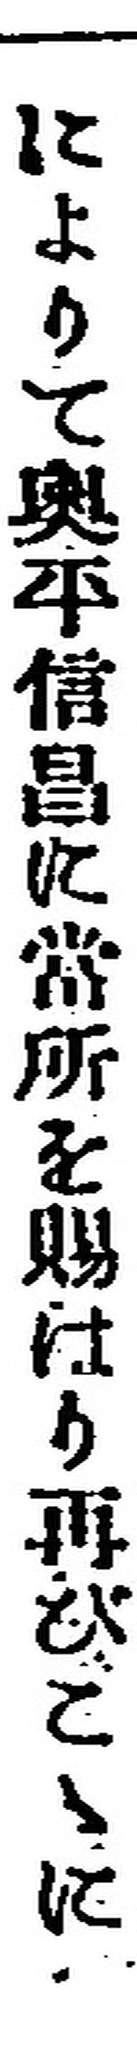によりて奥平信昌に当所を賜はり再びこゝに
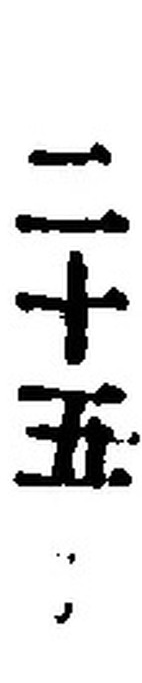二十五

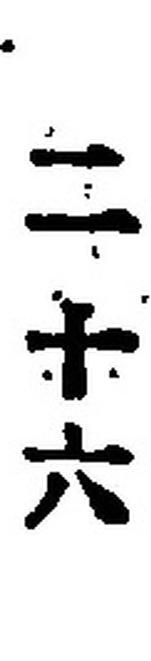二十六
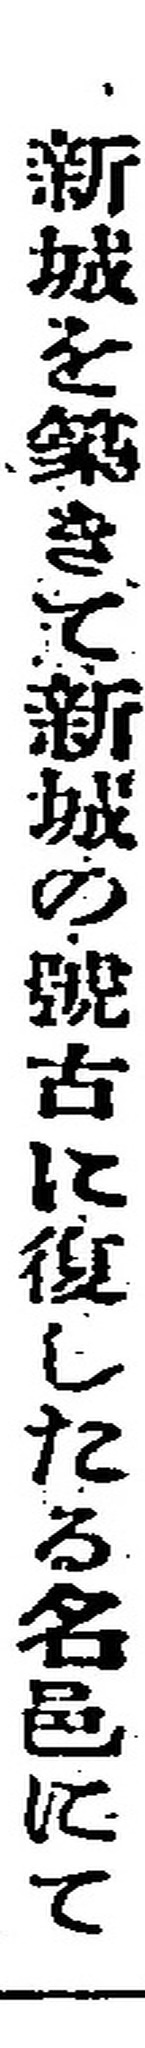新城を築きて新城の号古に復したる名邑にて
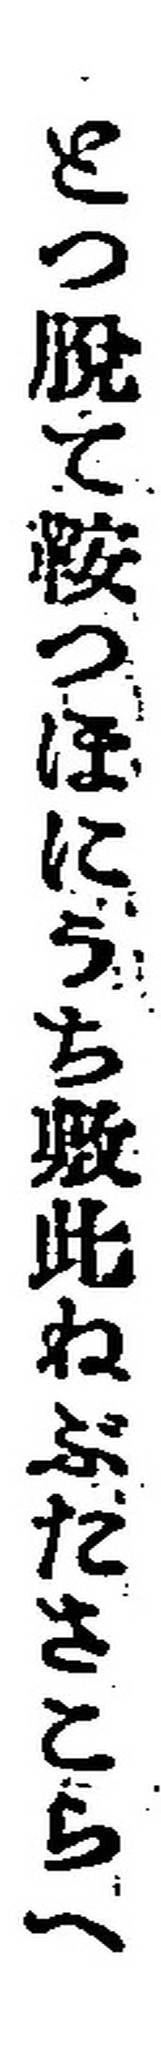とつ脱て鞍つほにうち敷此ねぶたさこらへ
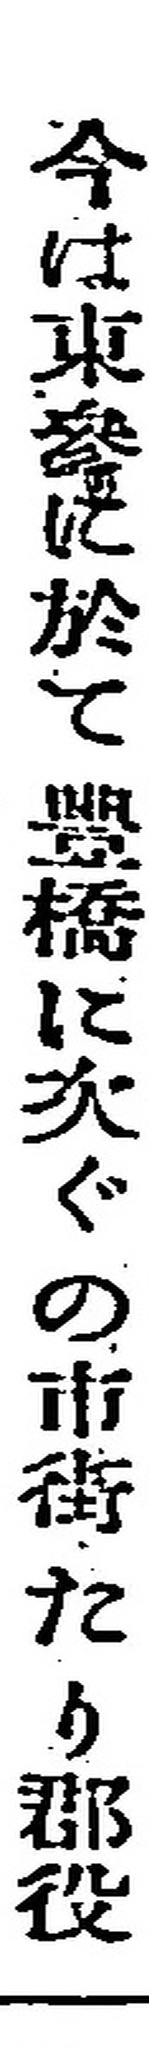今は東参に於て豊橋に次ぐの市街たり郡役
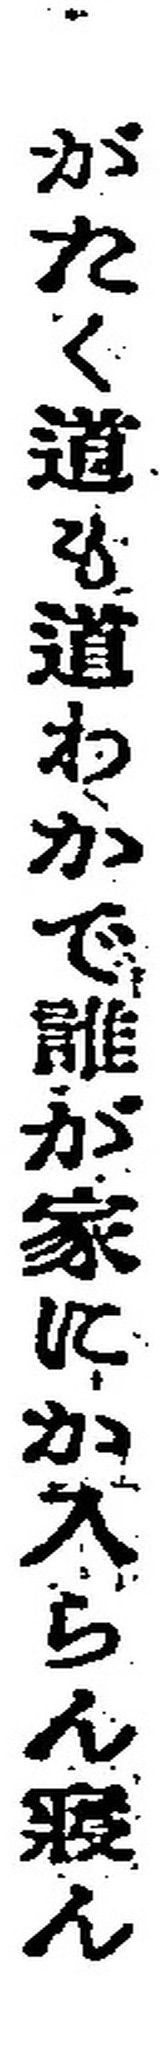がたく道も道わかで誰が家にか入らん寝ん
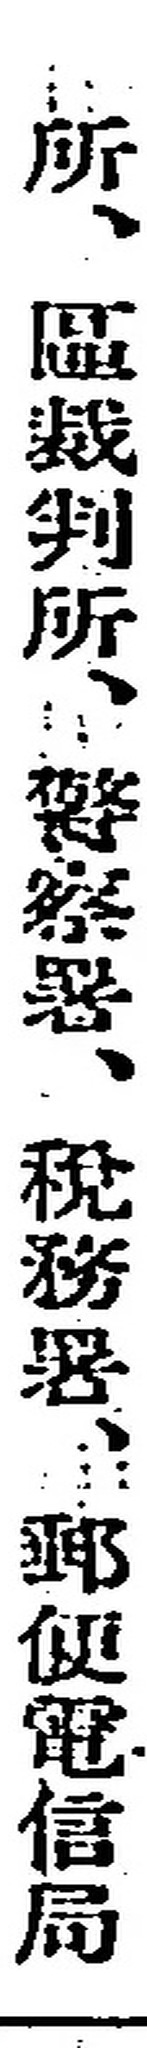所、区裁判所、警察署、税務署、郵便電信局
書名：東参名勝案内
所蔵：国立国会図書館 National Diet Library, JAPAN
